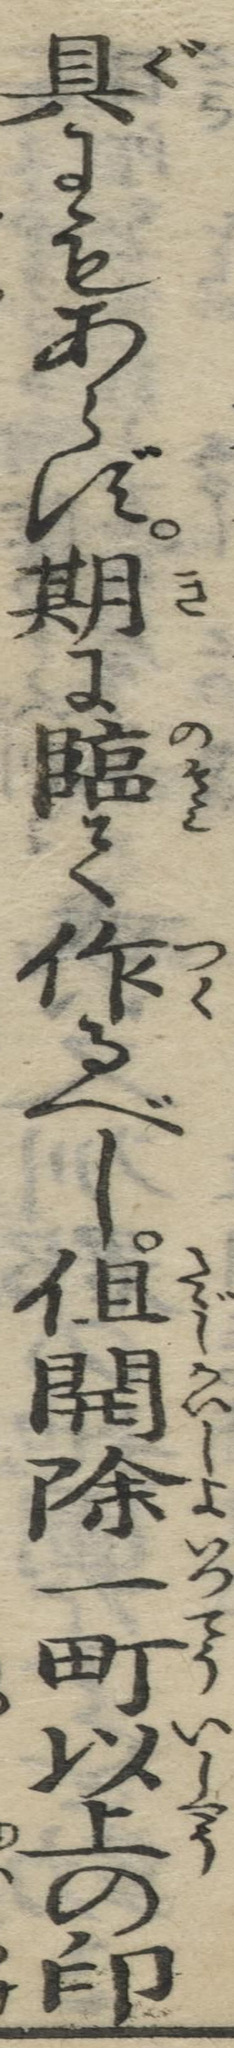具にもあらず。期に臨て作るべし。但開除一町以上の印
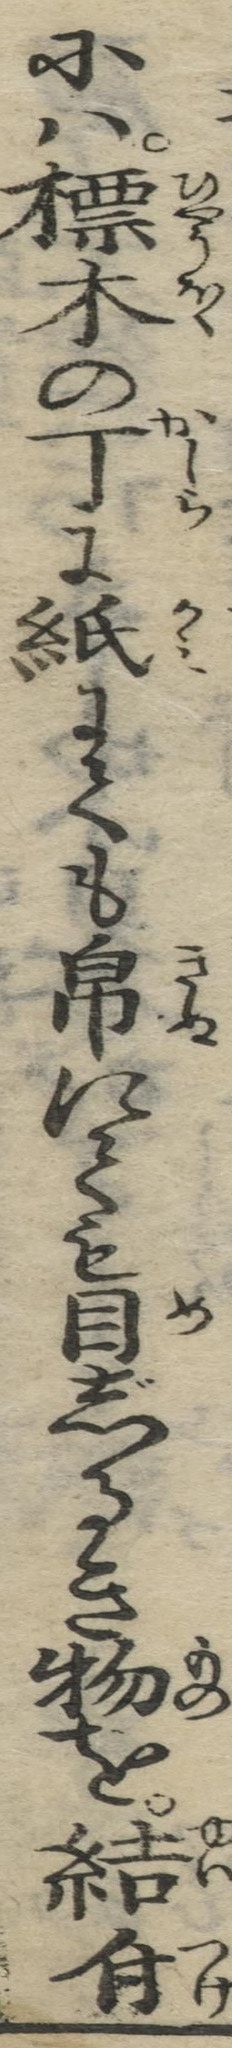には。標木の丁に紙にても帛にても目じるき物を。結付

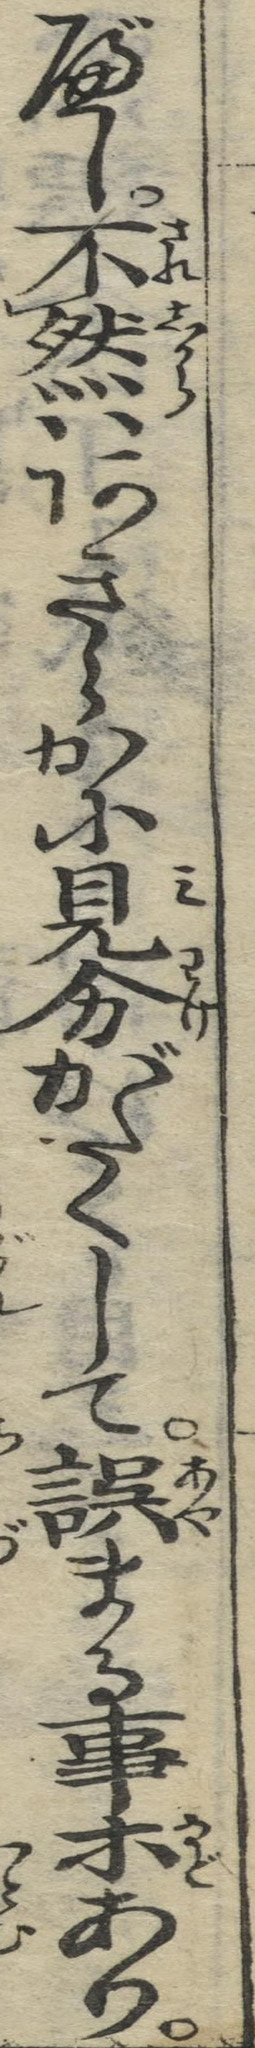べし。不然はあきらかに見分がたくして。誤まる事等あり。
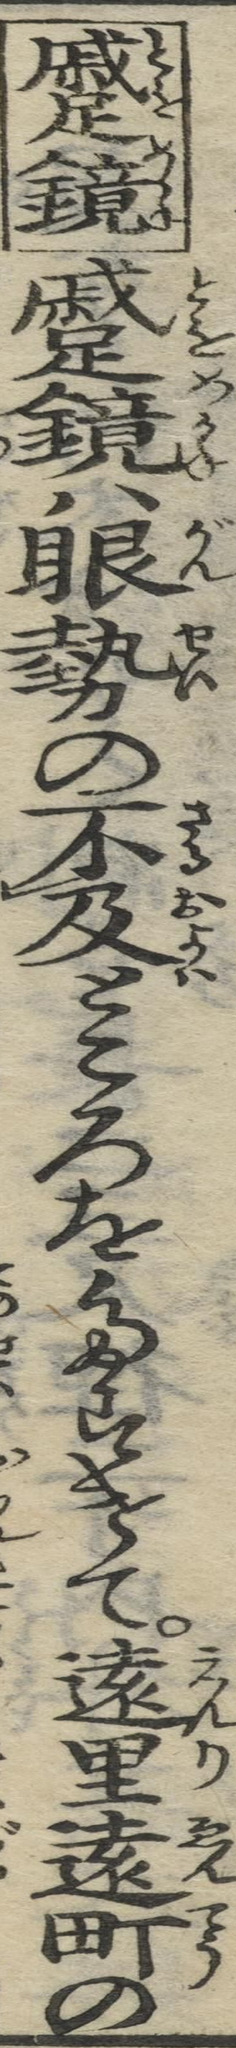蹙鏡蹙鏡は眼勢の不及ところをたすけて。遠里遠町の
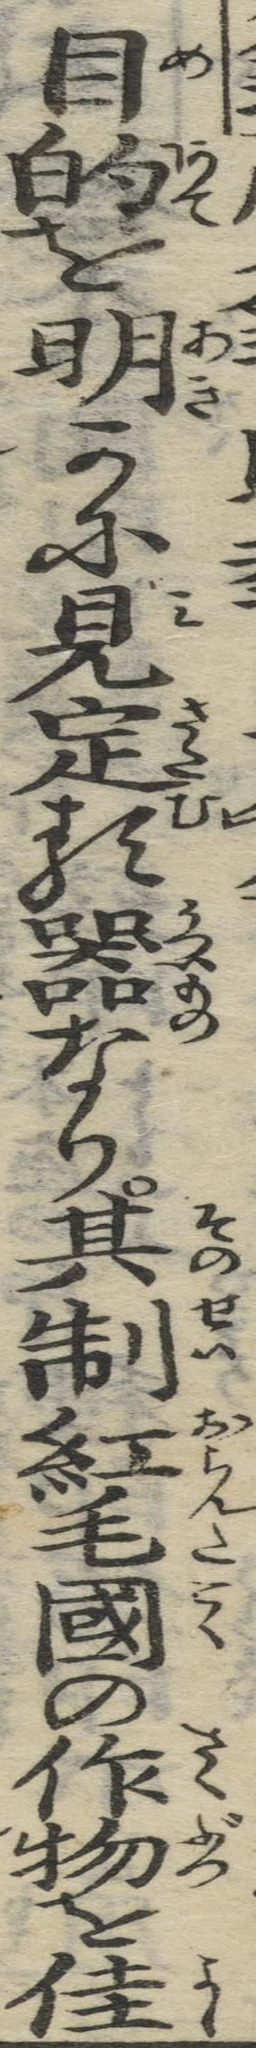目的を明かに見定る器なり。其制紅毛国の作物を佳
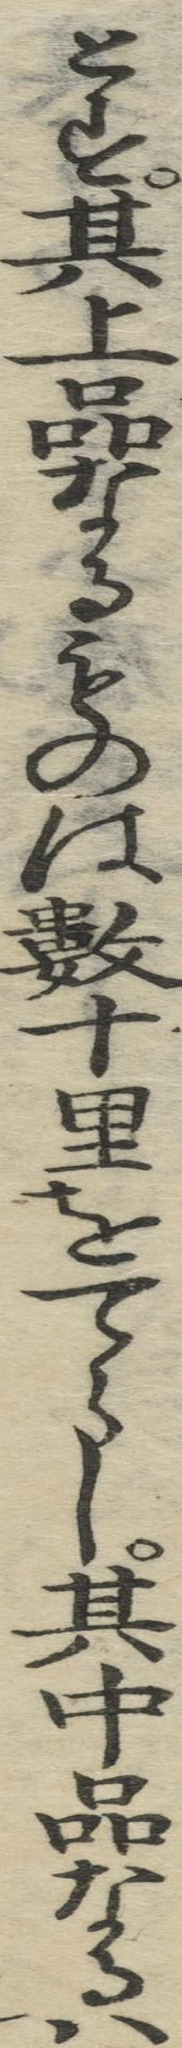とす。其上品なるものは数十里をてらし。其中品なるは
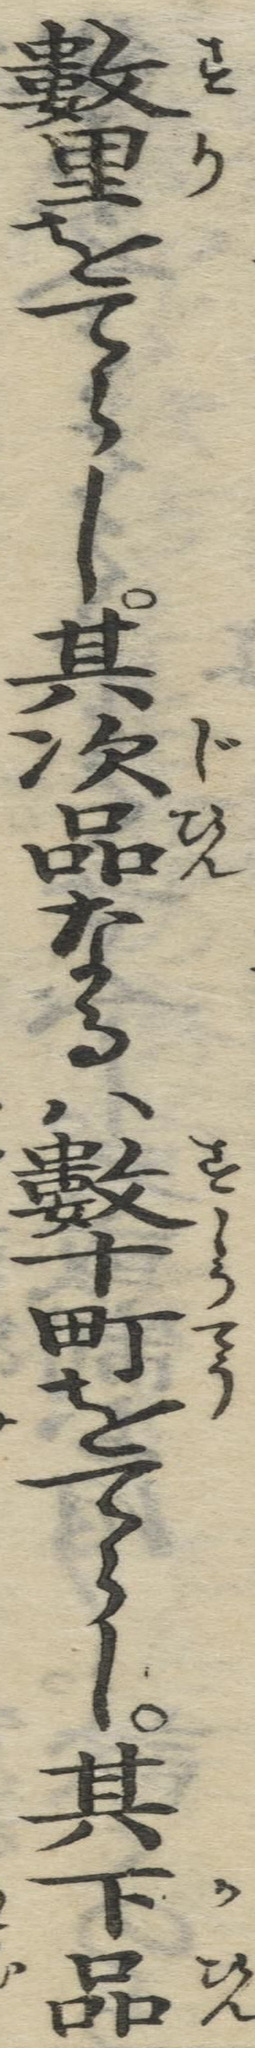数理をてらし。其次品なるは数十町をてらし。其下品
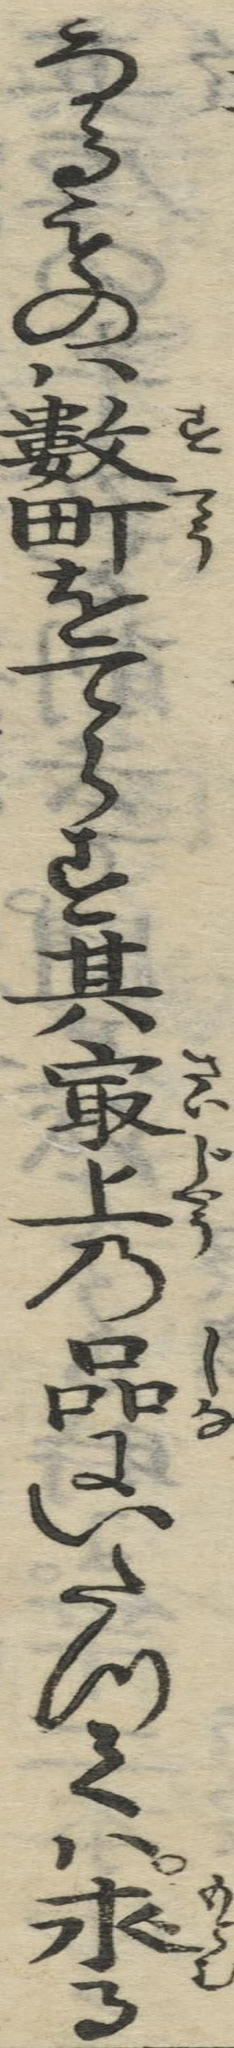なるものは数町をてらす其最上の品にいたつては。求る
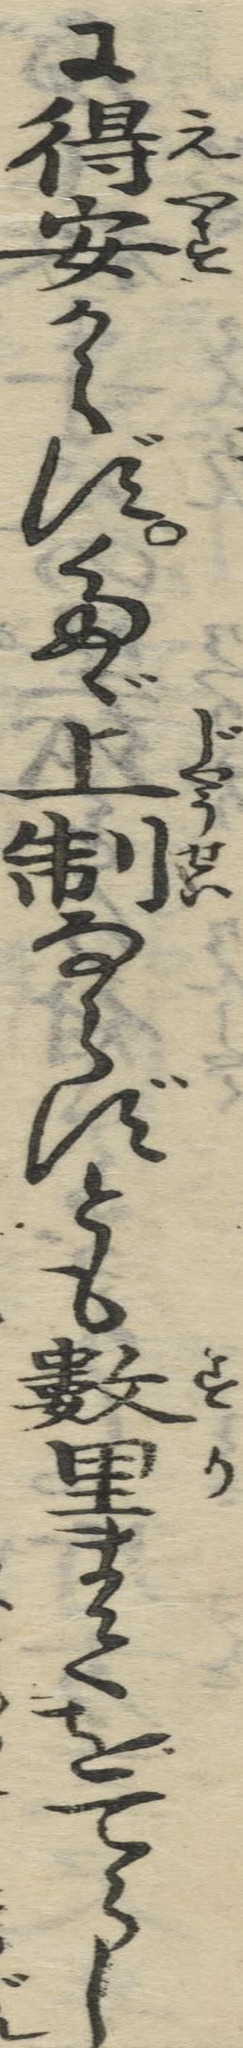に得安からず。たゞ上制ならずとも数理まてをてらし
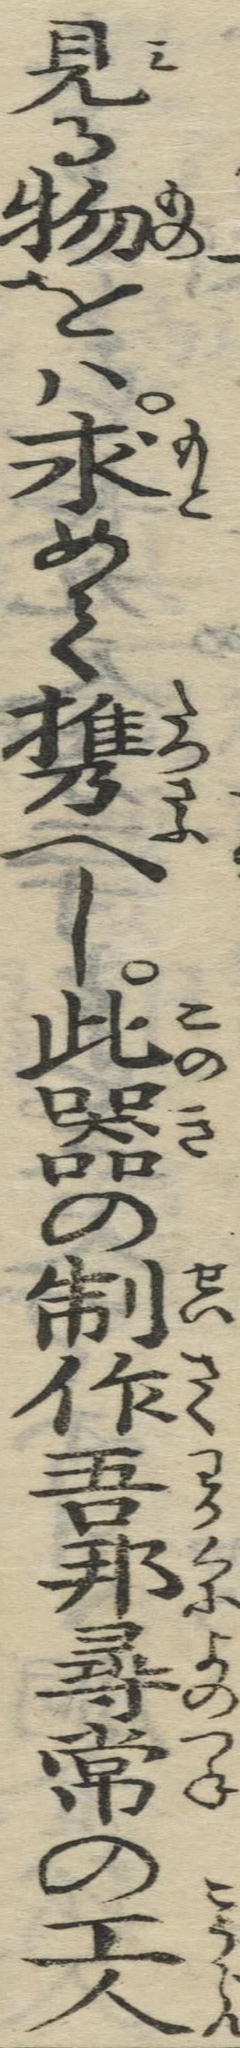見る物をは。求めて携へし。此器の制作吾邦尋常の工人
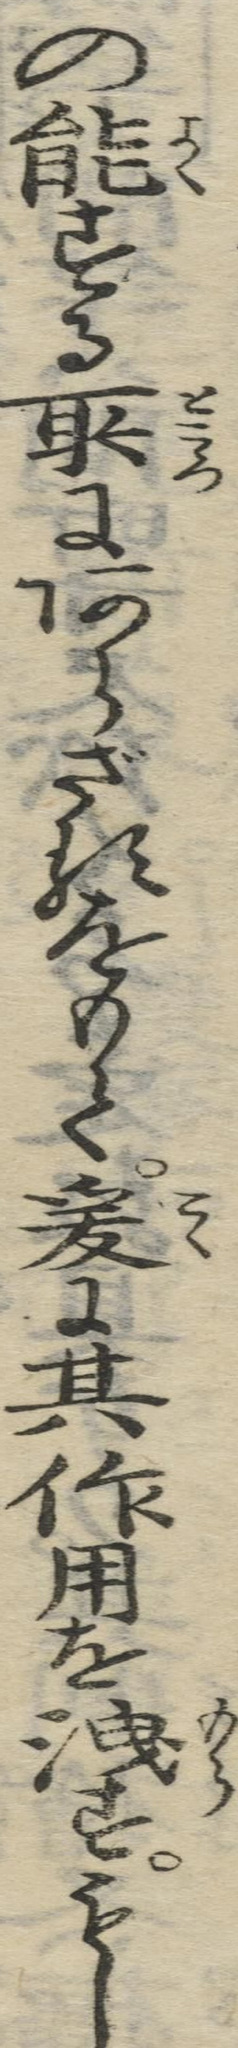の能する所にあらざるをもて。爰に其作用を洩す。もし
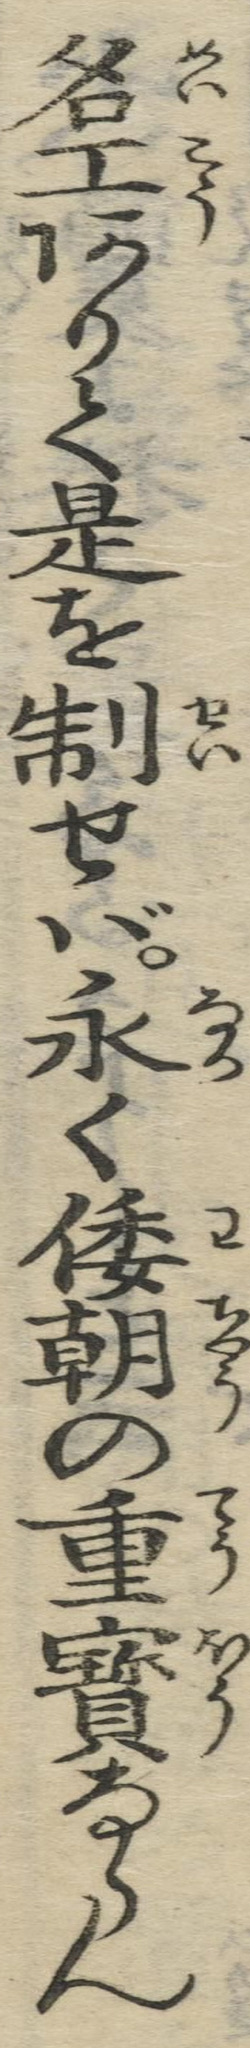名工ありて是を制せば。永く倭朝の重宝ならん
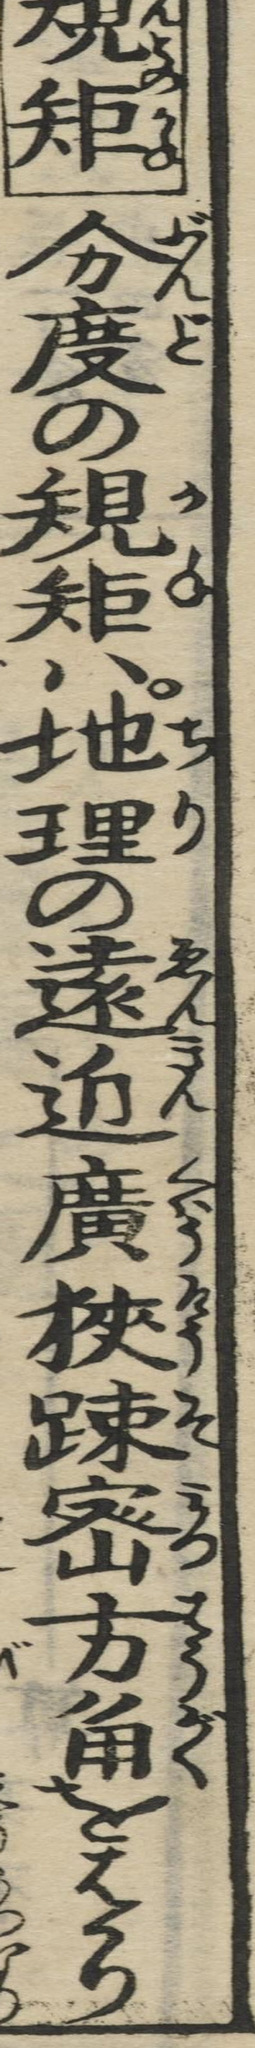規矩分度の規矩は。地理の遠近広狭粗密方角をはかり
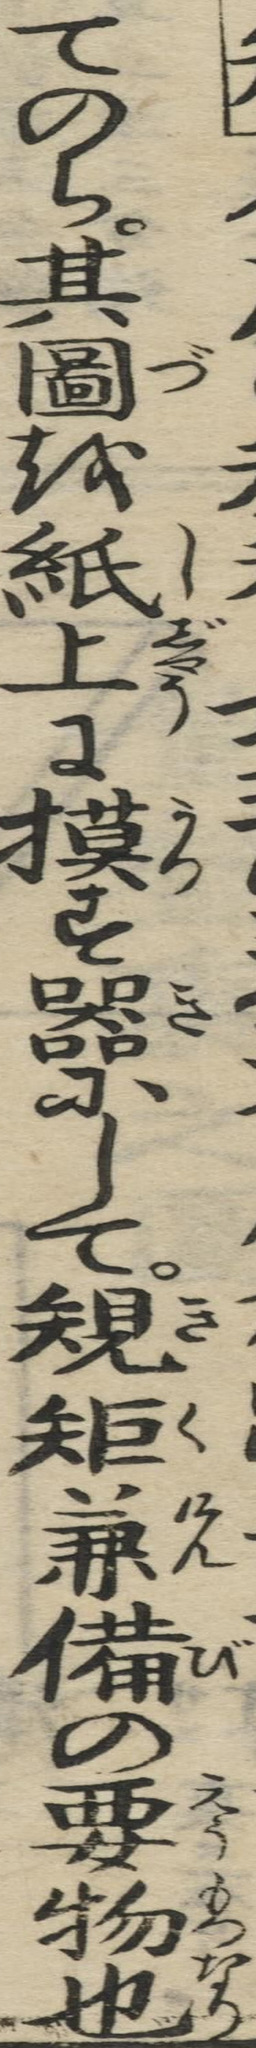てのち。其図を紙上に模す器にして。規矩兼備の要物也
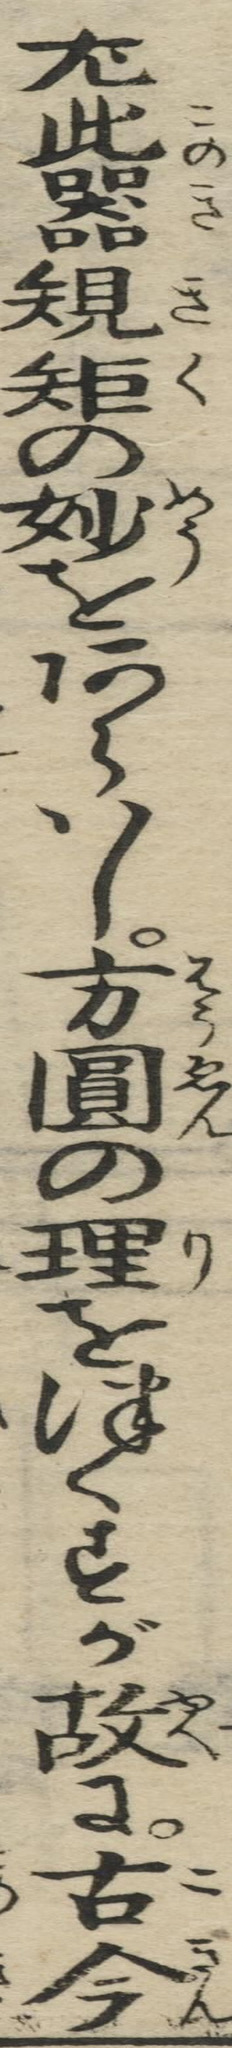尤此器規矩の妙をあらはし。方円の理をつくすが故に。古今
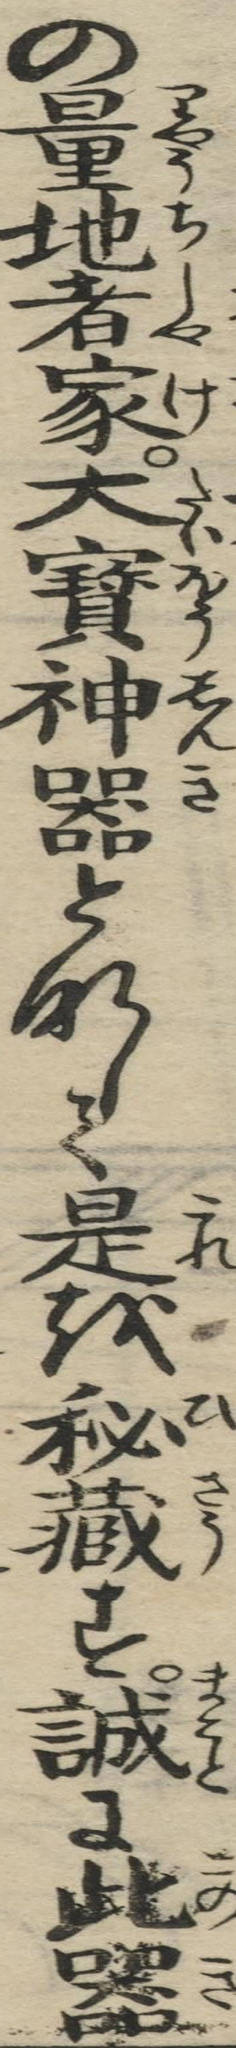の量地者家。大宝神器となして是を秘蔵す。誠に此器
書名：量地指南　巻之一（内題）
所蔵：東京大学地震研究所図書室 Earthquake Research Institute Library, The University of Tokyo, JAPAN
